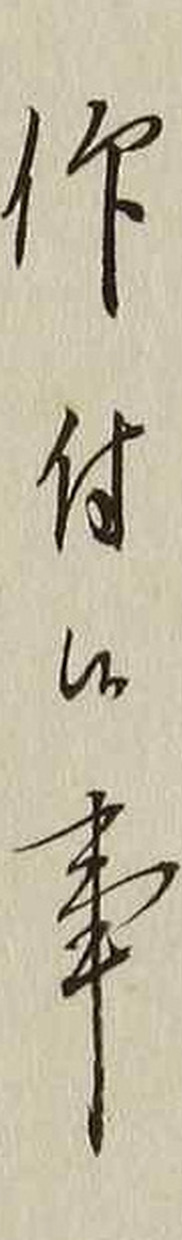仰付候事
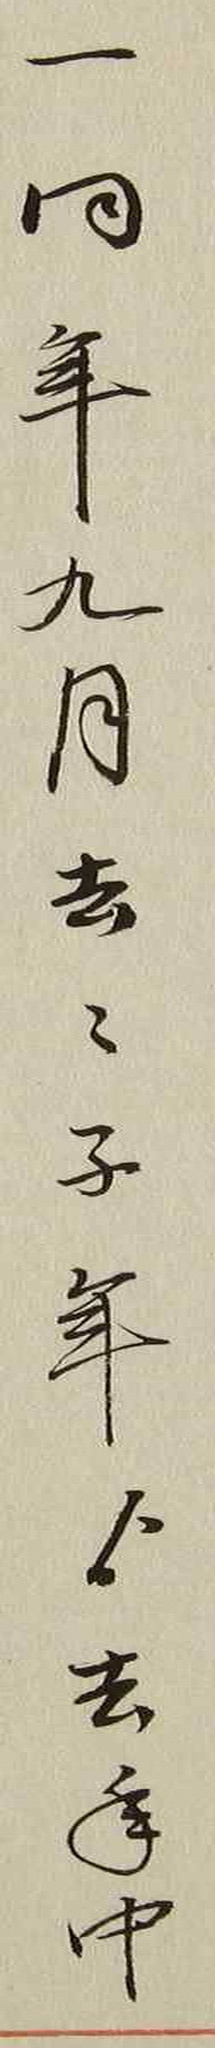一同年九月去々子年ゟ去年中
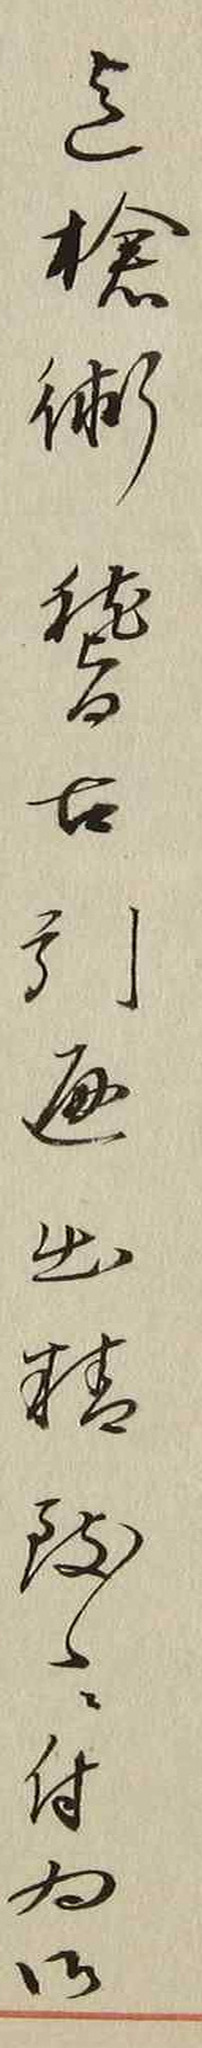迄槍術稽古引通出精致候ニ付為御
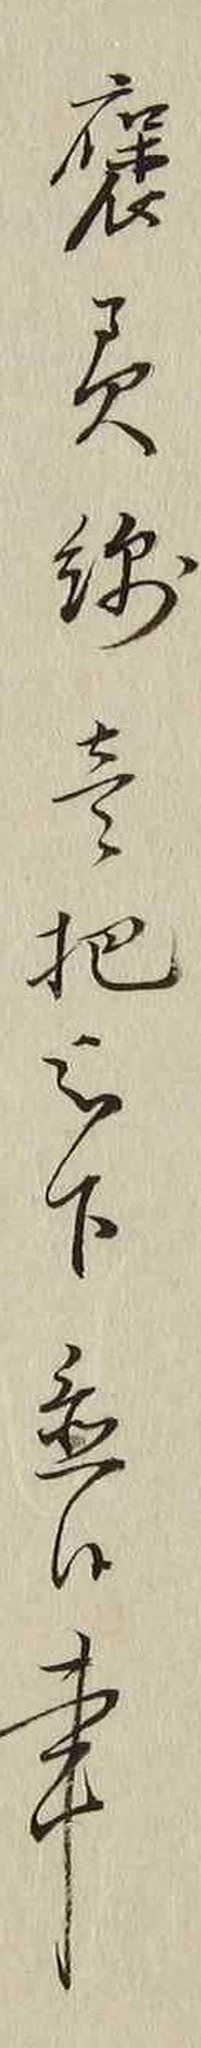褒美綿壱把被下置候事
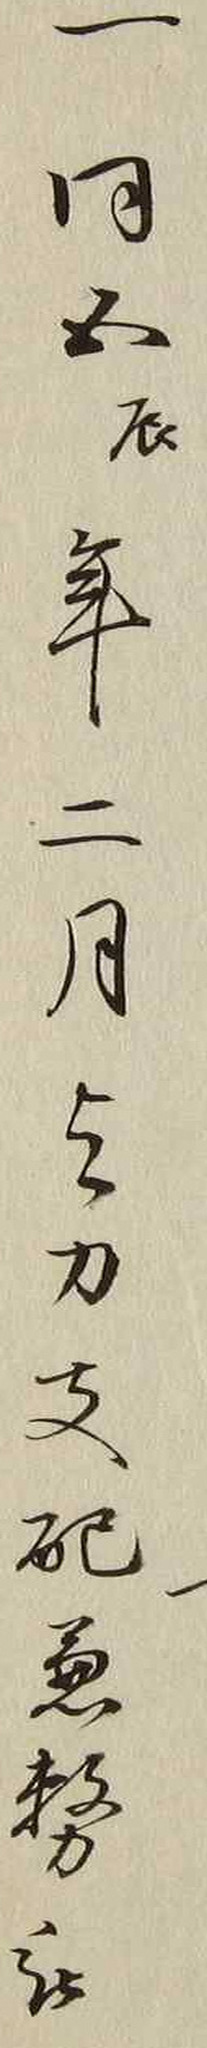一同五辰年二月与刀支配兼務被
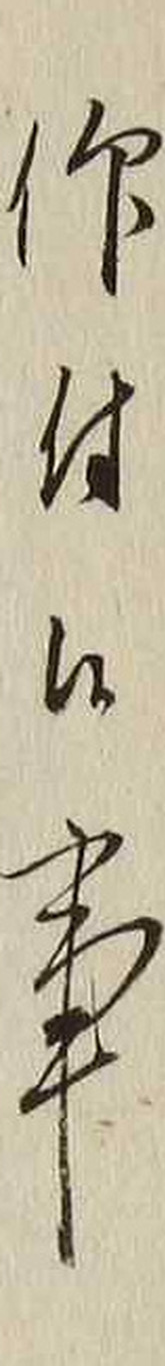仰付候事
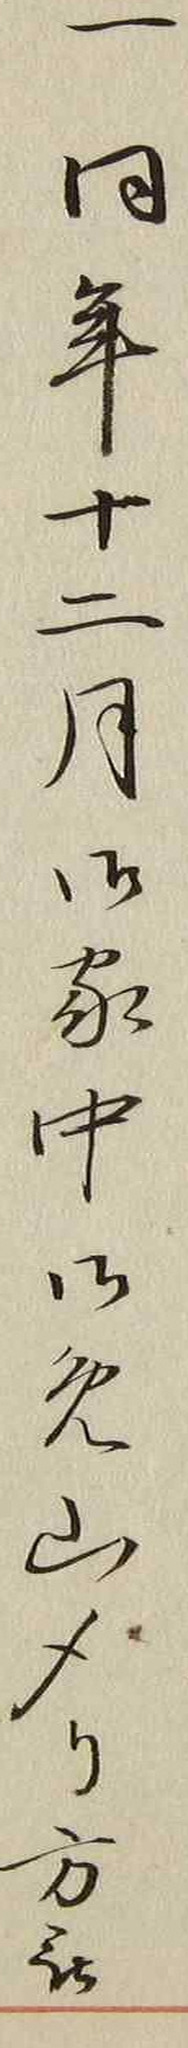一同年十二月御家中御免山〆り方被
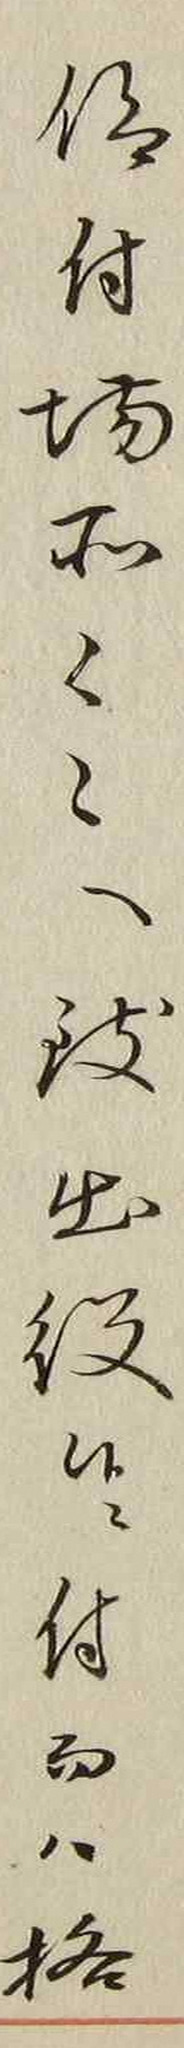仰付場所々々へ致出役候ニ付而ハ格
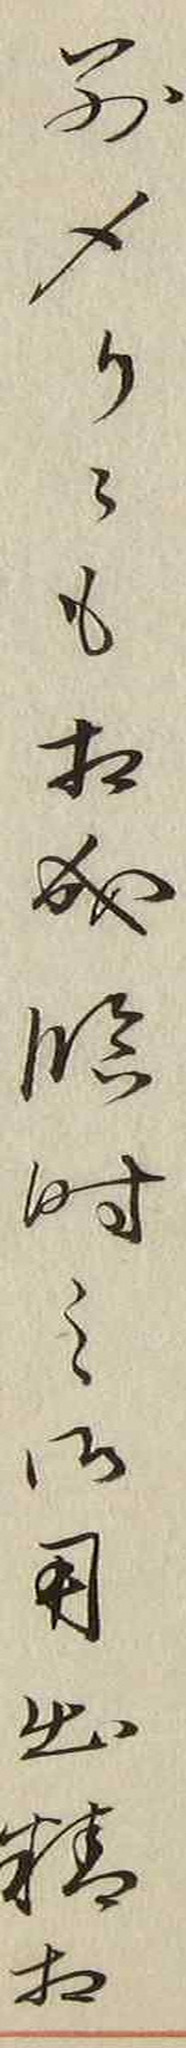別〆りニも相成臨時之御用出精相
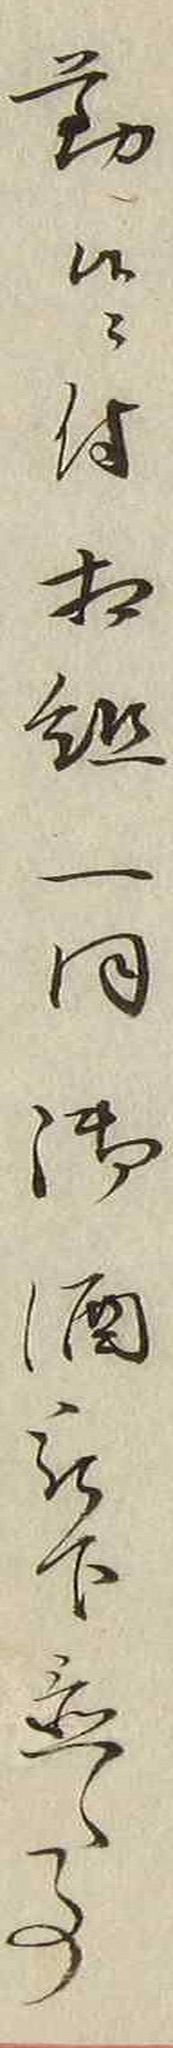勤候ニ付相組一同御酒被下置候事
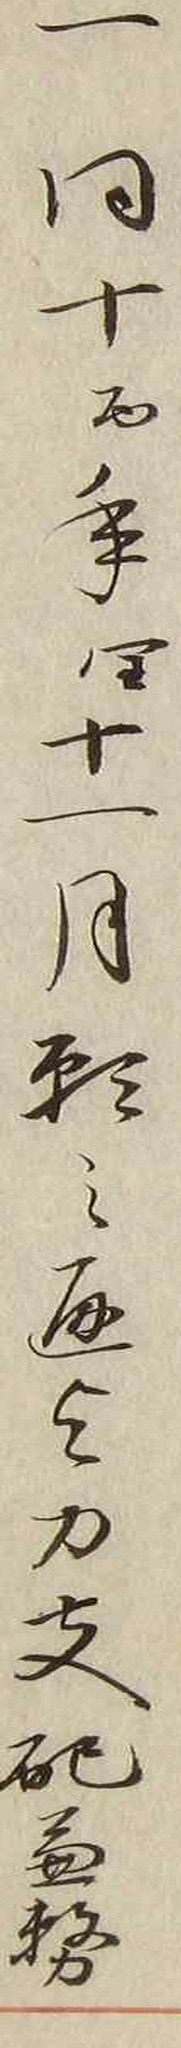一同十酉年閏十一月願之通与力支配兼務
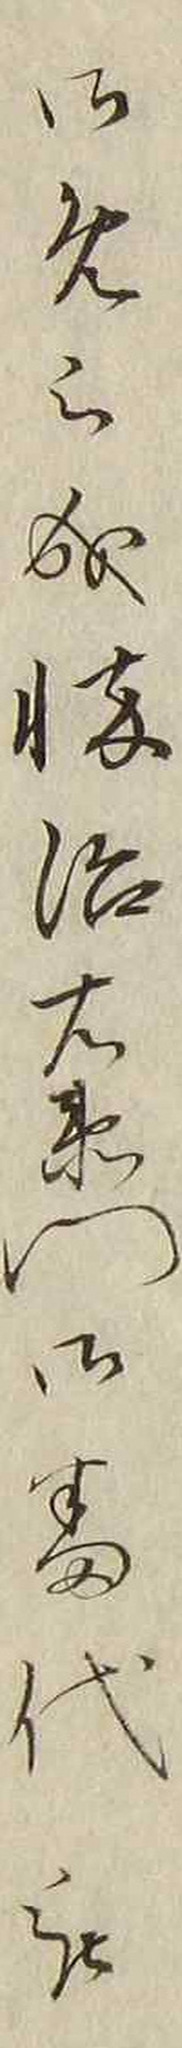御免被成悴治右衛門御番代被

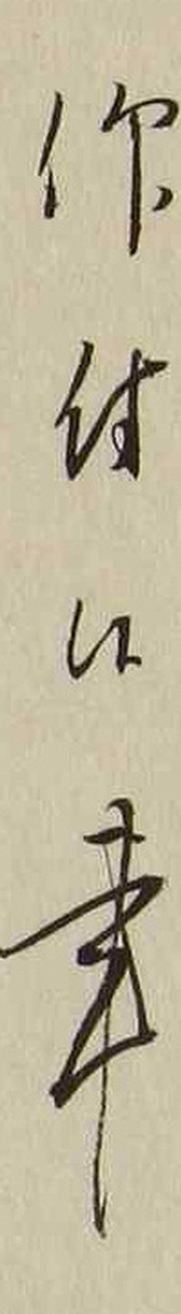仰付候事
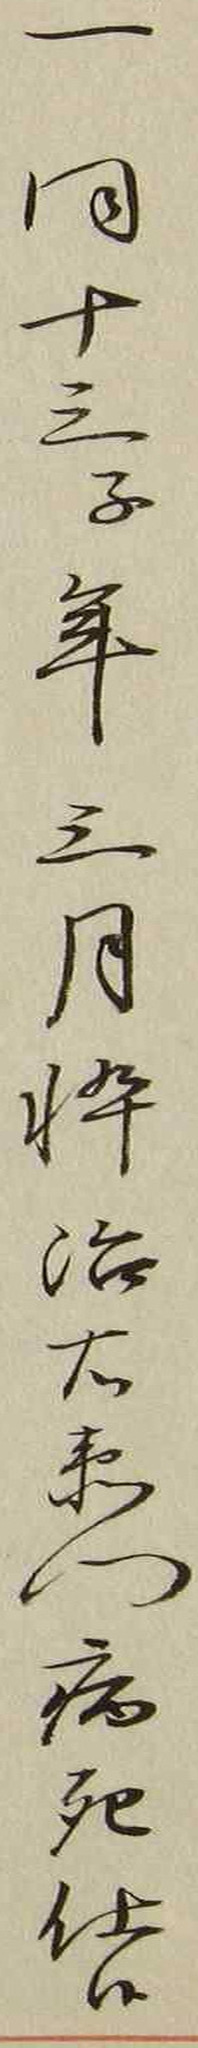一同十三子年三月忰治右衛門病死仕候
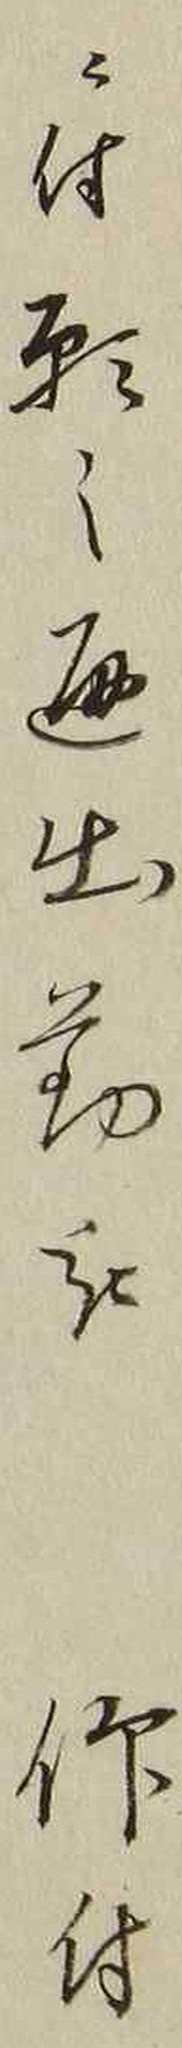ニ付願之通出勤被仰付
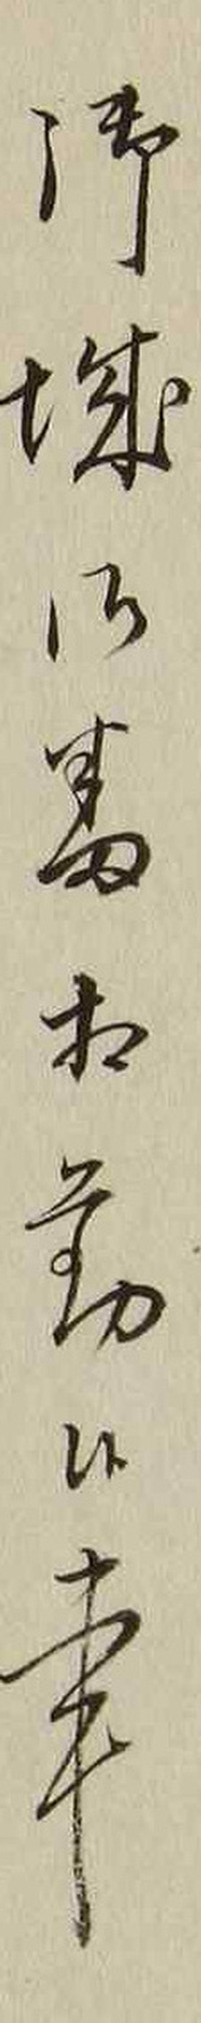御城御番相勤候事
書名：諸士系譜　巻之22　い之部22
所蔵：会津若松市立会津図書館
